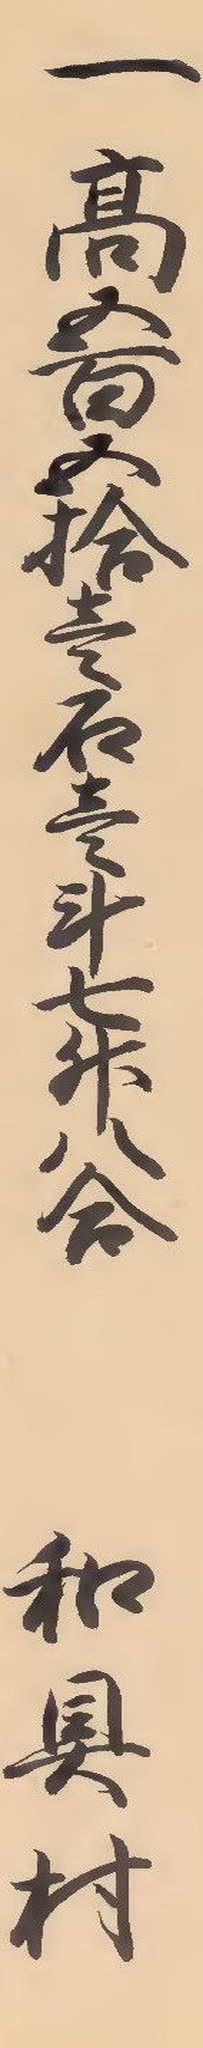一高五百五拾壱石壱斗七升八合和具村
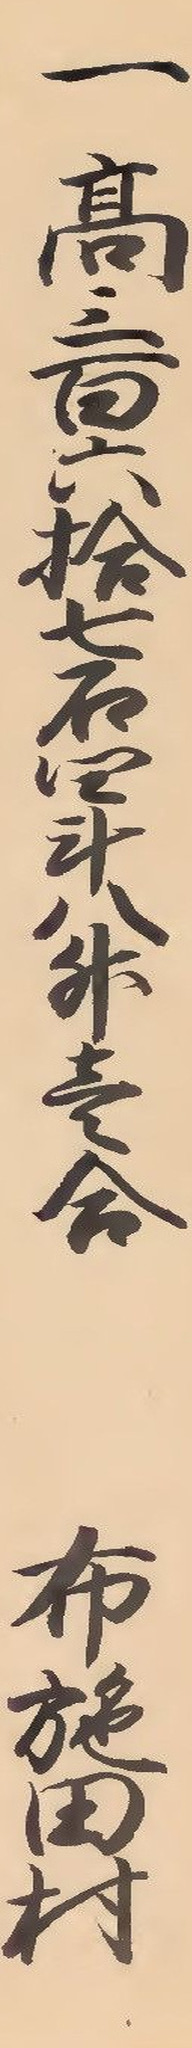一高三百六拾七石四斗八升壱合布施田村
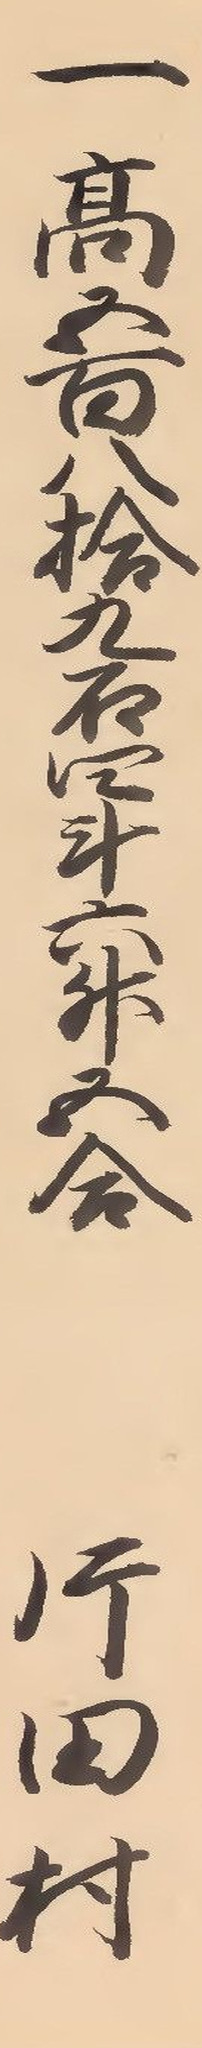一高五百八拾九石四斗六升五合片田村
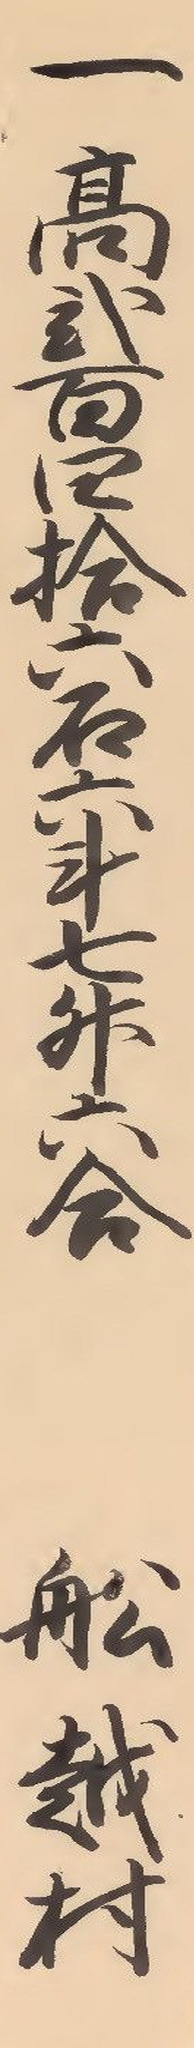一高弐百四拾六石六斗七升六合船越村
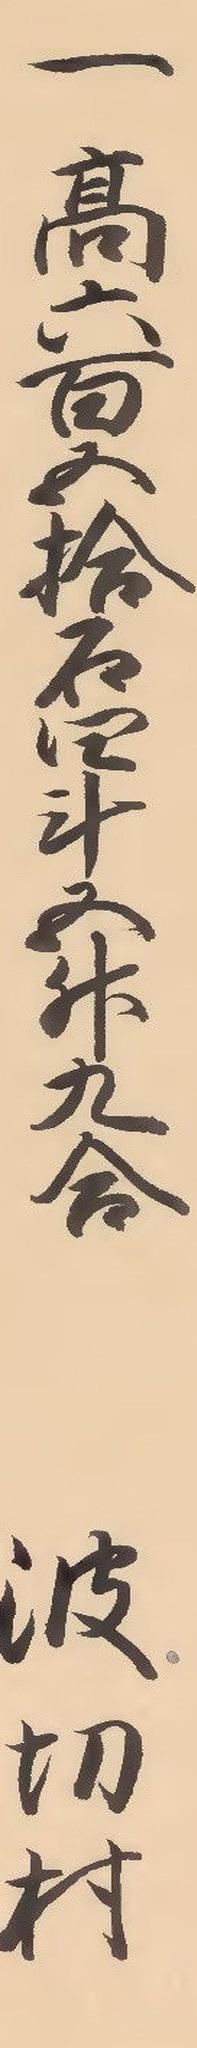一高六百五拾石四斗五升九合波切村
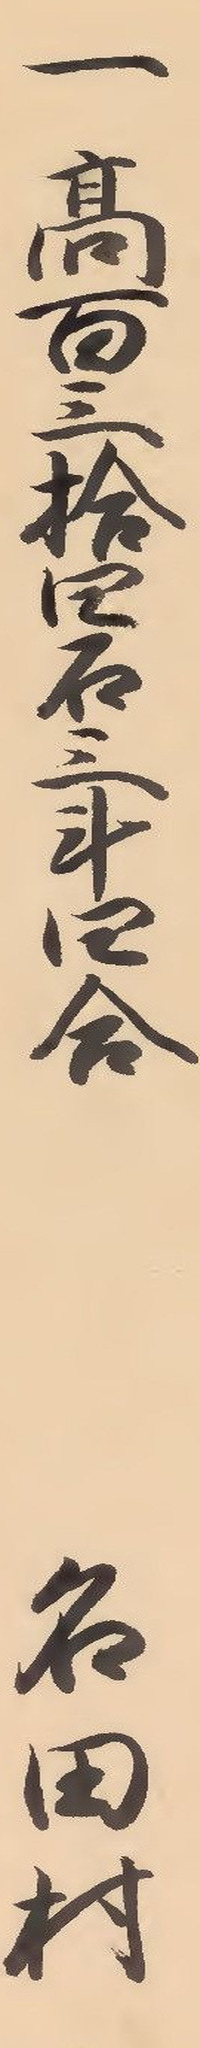一高百三拾四石三斗四合名田村

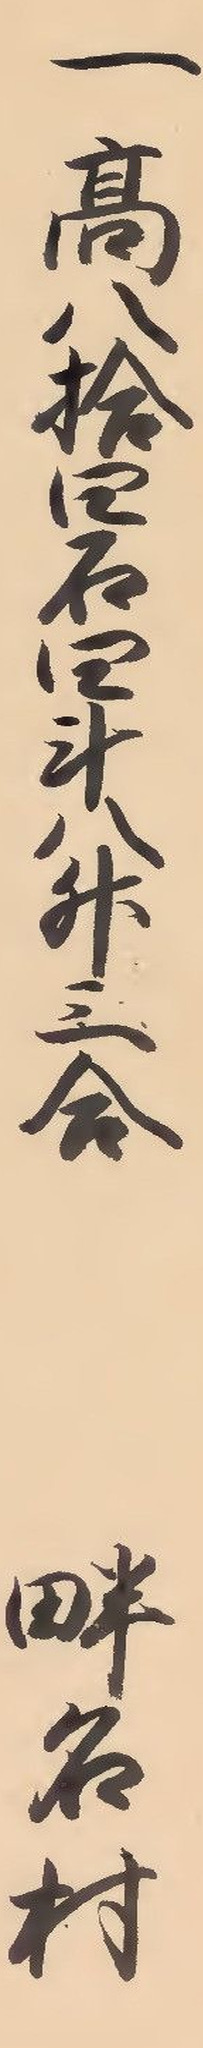一高八拾四石四斗八升三合畔名村
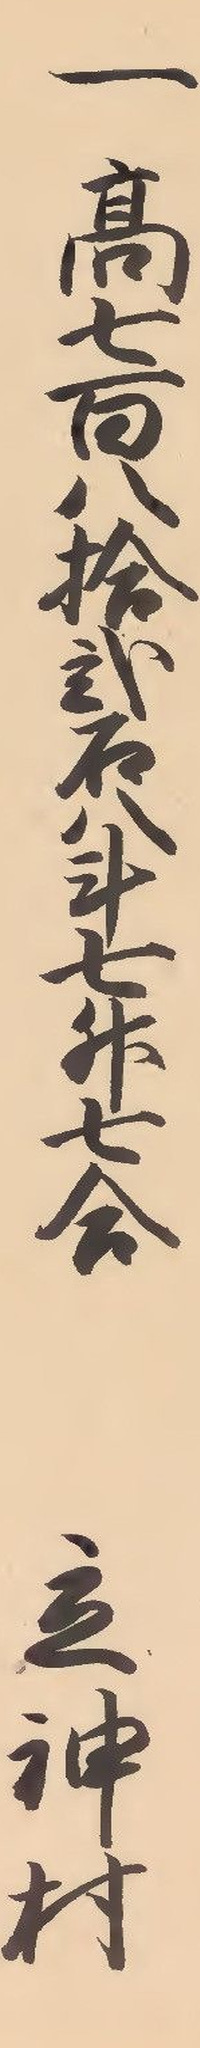一高七百八拾弐石八斗七升七合立神村
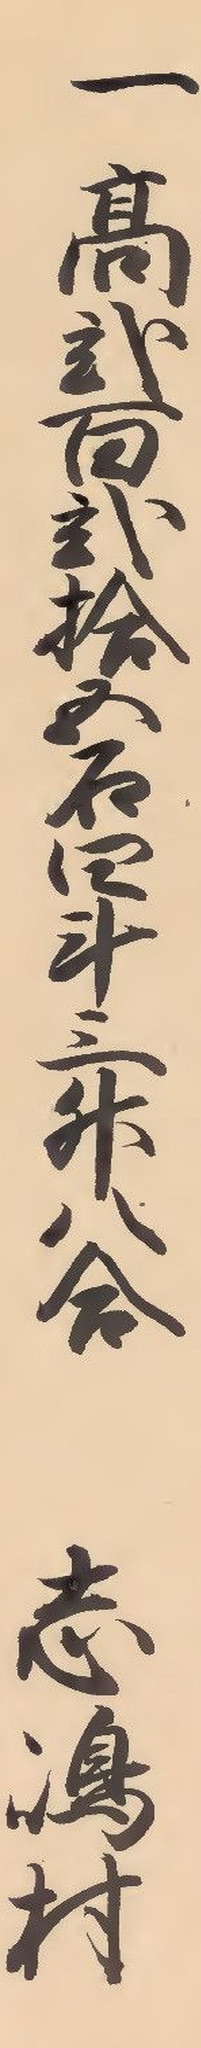一高弐百弐拾五石四斗三升八合志島村
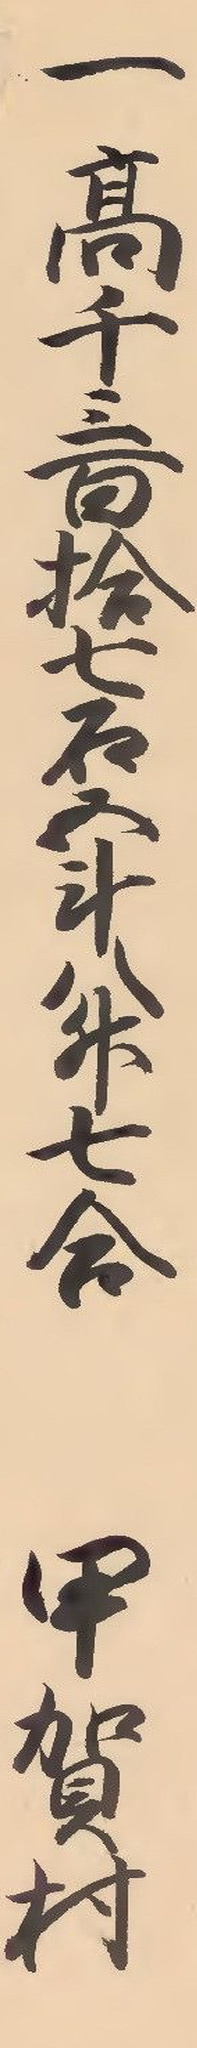一高千三百拾七石五斗八升七合甲賀村
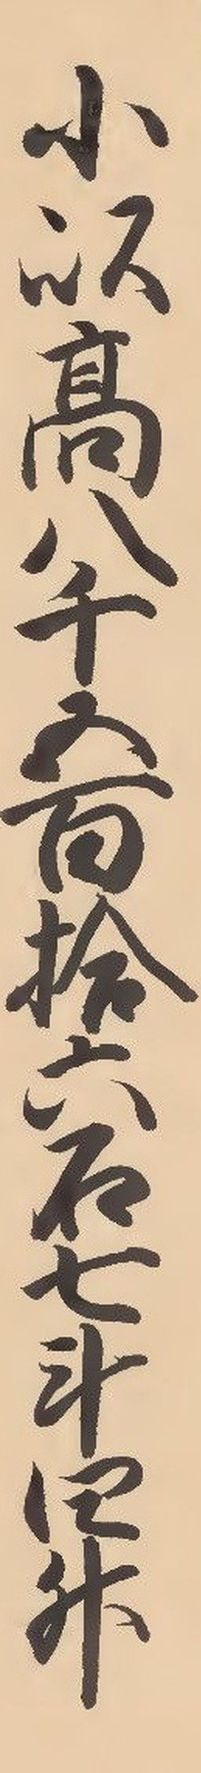小以高八千五百拾六石七斗四升
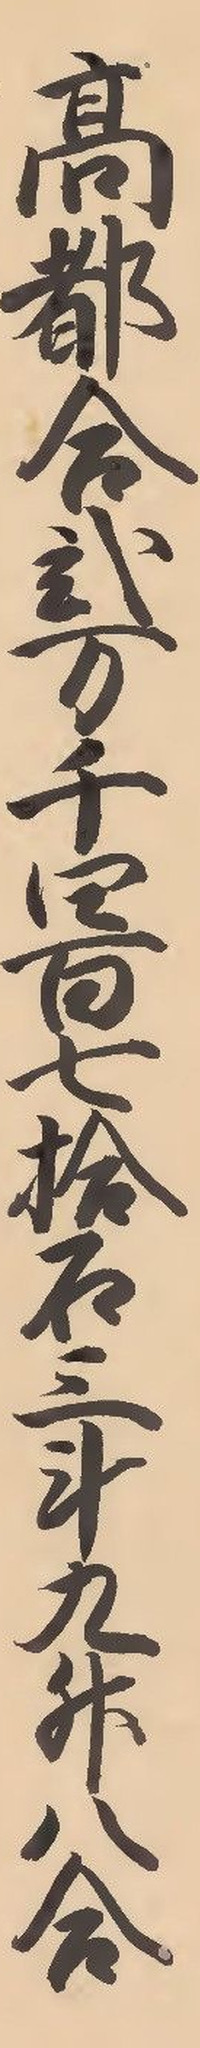高都合弐万千四百七拾石三斗九升八合
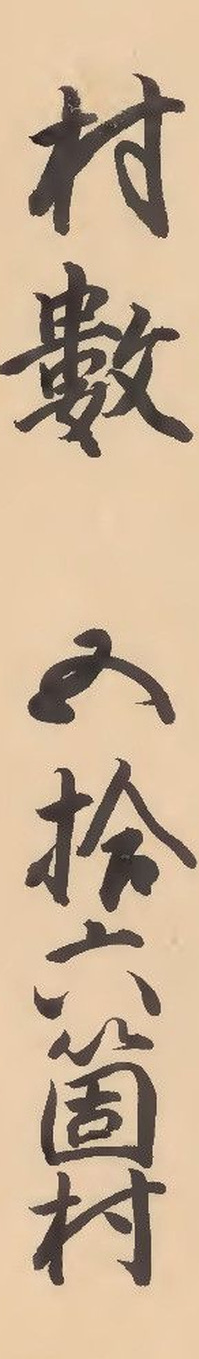村数五拾六箇村

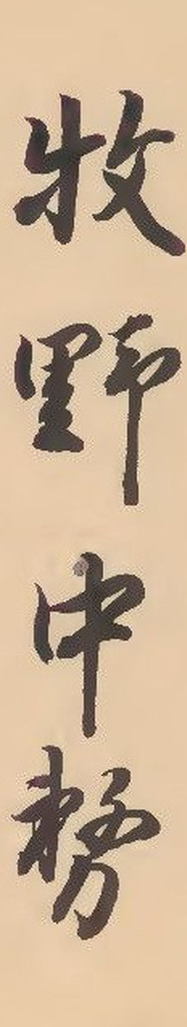牧野中務
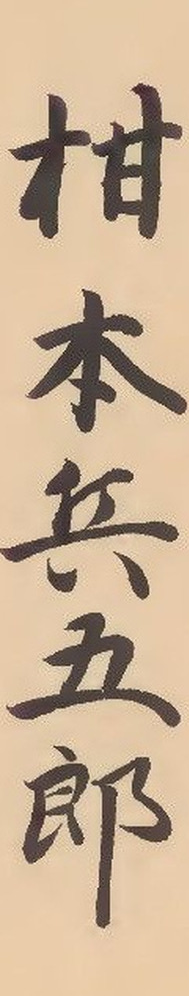柑本兵五郎
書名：志摩国郷帳
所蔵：国立公文書館 National Archives of Japan
